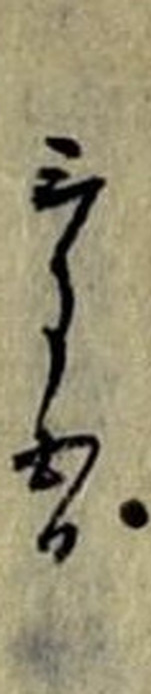三月五日
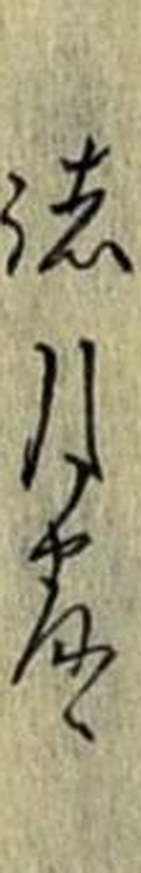諸月番へ
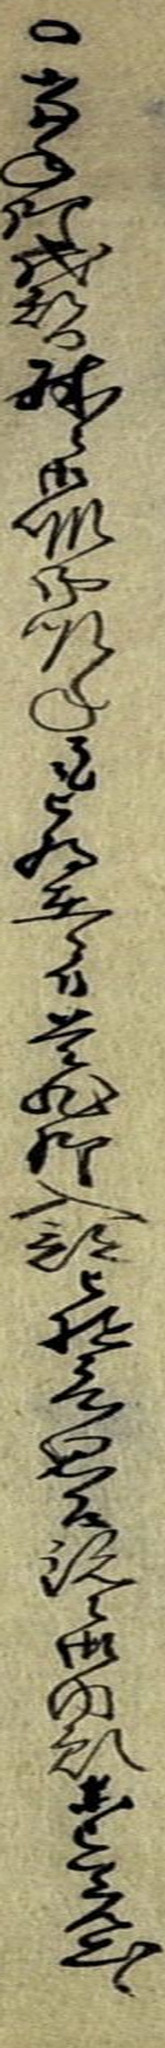○当年御代替殊ニ御暇御順年ニも被為在候ニ付是非御入部被遊度思召既ニ御内願等迄差出候
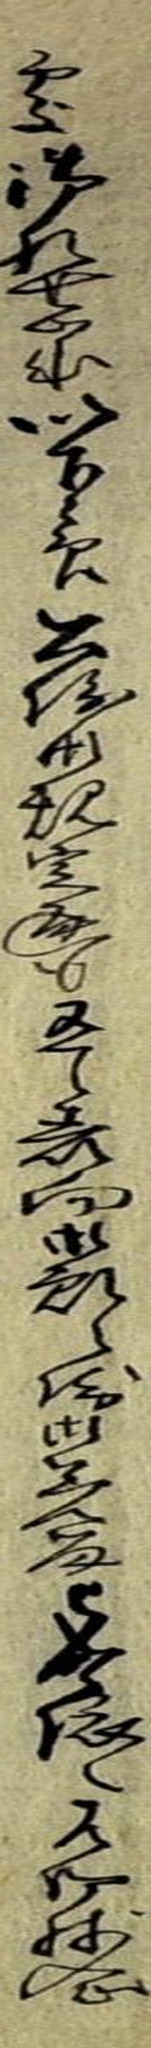処御拾七歳以下ニ而ハ公儀御規定通も有之表向御願之儀御差留被成候依之乍御残念
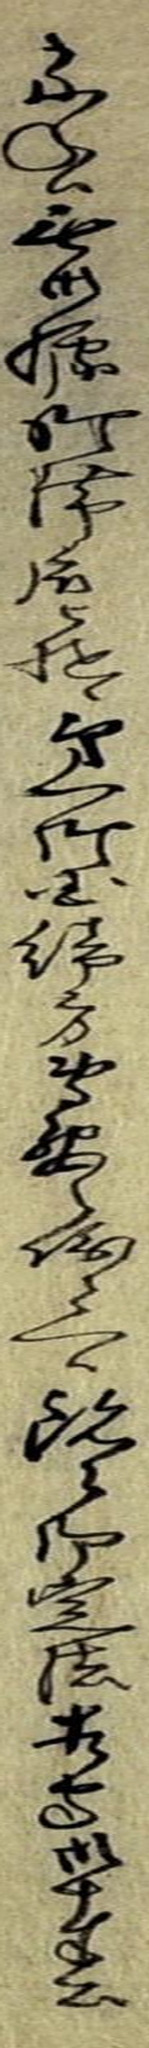当年ハ無御処御滞府被遊候第一御国締方専要之儀ニ候へハ既ニ御定法相守御奉公
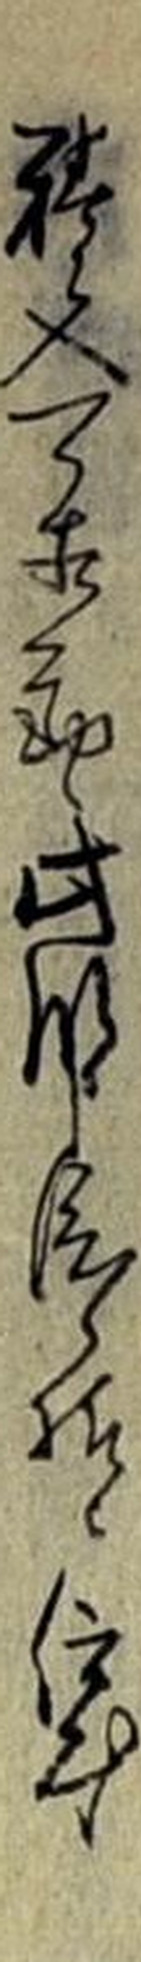精ニ入可相勤候此段申渡候様被仰出候
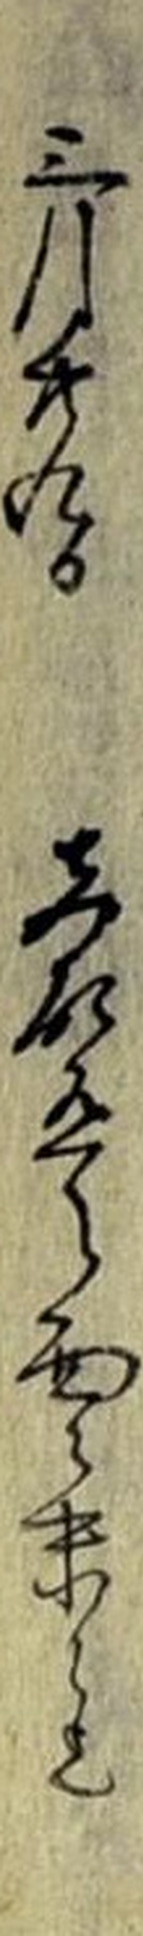三月廿九日支配有之面々末々迄
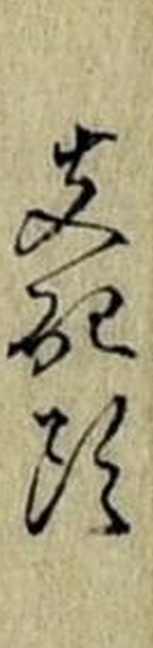支配頭
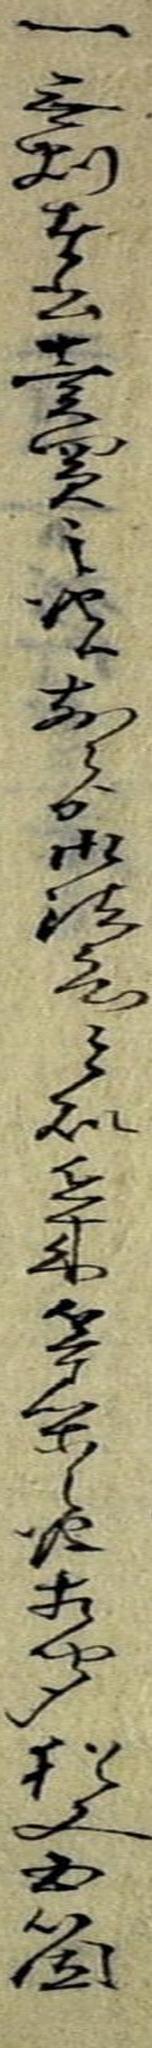一無判奉書売買之儀ハ前々ゟ御法度ニ候処近来等閑之儀相聞猶又五箇
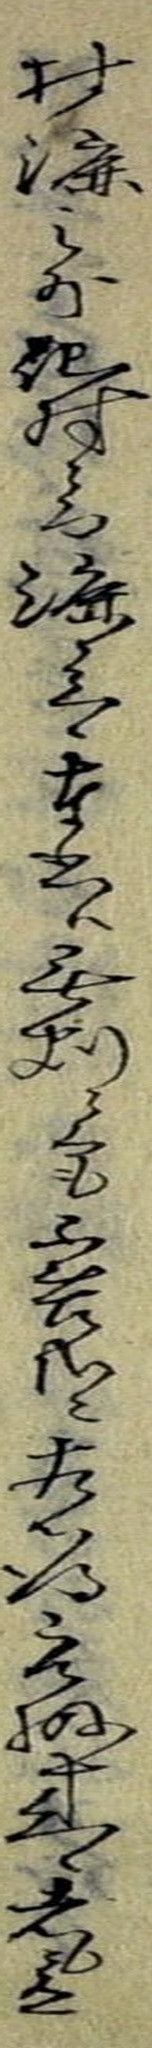村漉之外他村ニ而漉候ハヽ奉書ハ無判ニ而も不苦哉ニ相心得取扱来候者も有
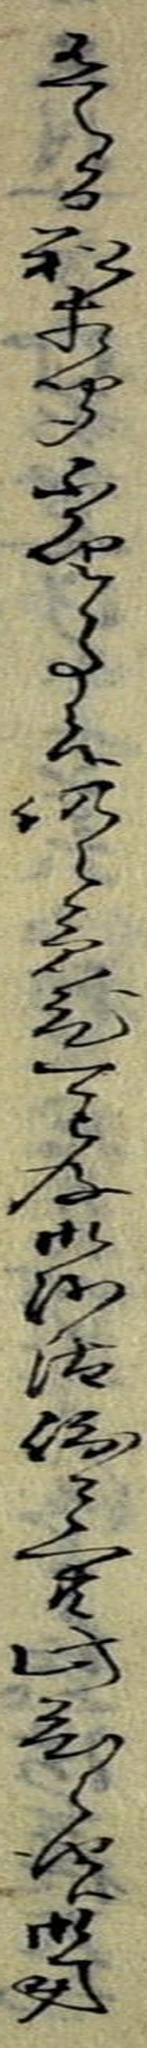有之旨粗相聞不届之事ニ候仍之急度可被及御沙汰候へ共此度之儀ハ御用
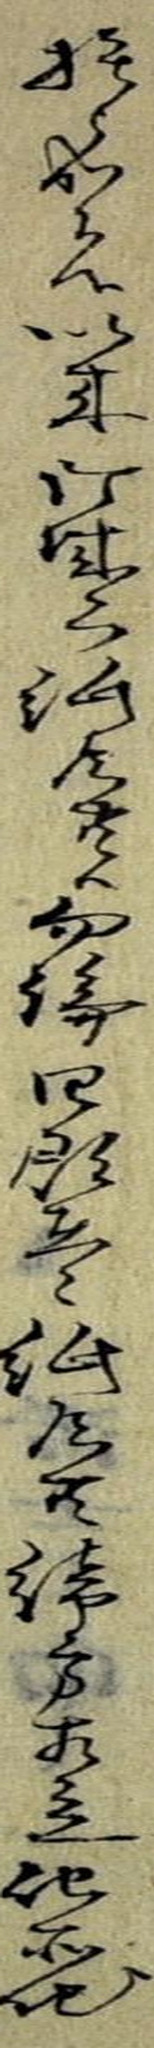捨被成下候以来御城下紙屋共ハ勿論四郡在々紙屋共締方相立他所他
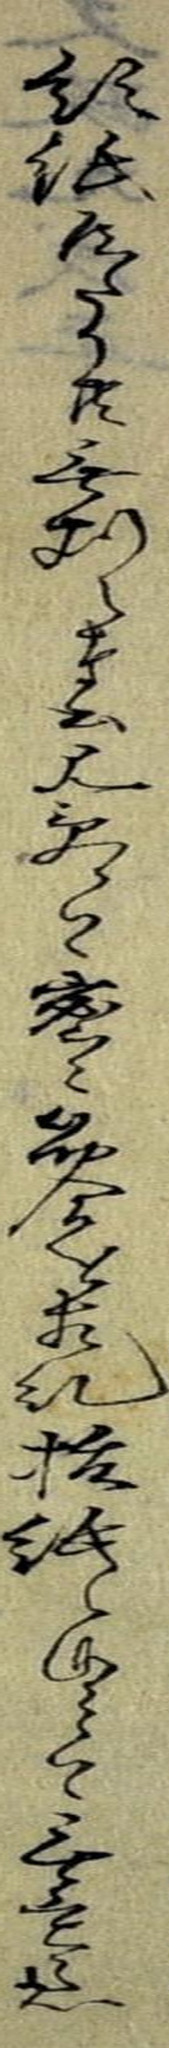領紙屋たり共無判之奉書見受候ハヽ密々筋合を相糺抜紙之趣ニ候ハヽ無遠慮
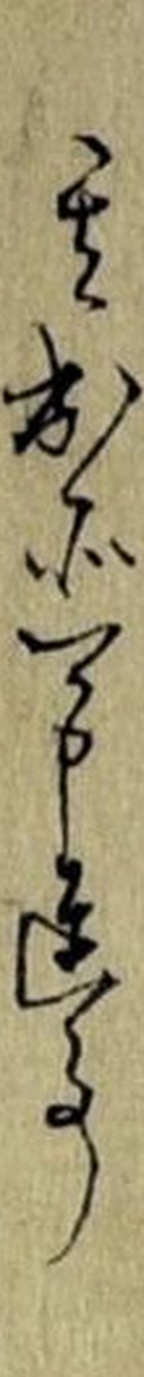其出所可申達事
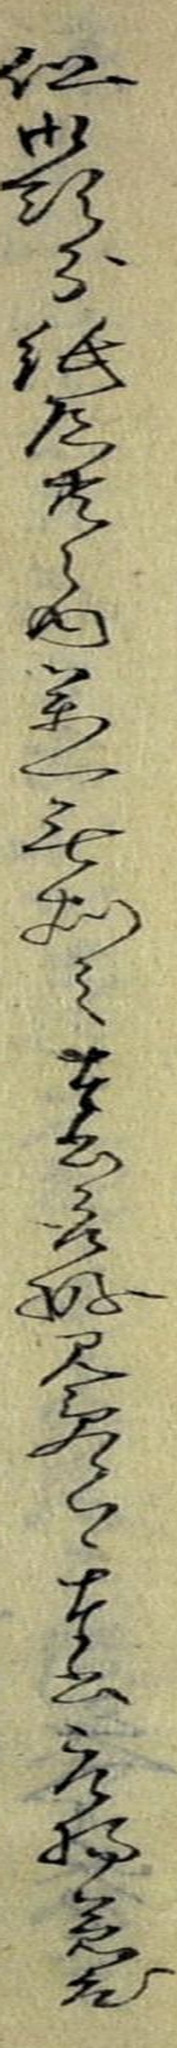但御領分紙屋共之内万一無判之奉公取扱見受候ハヽ奉書取揚急度
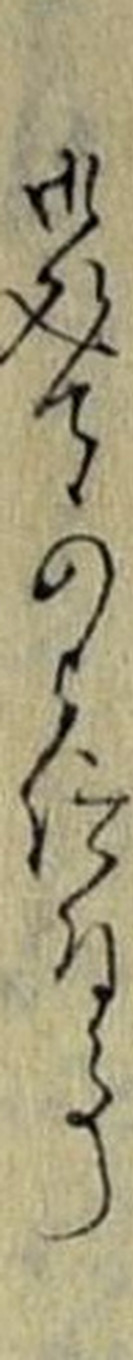御咎可被仰付事
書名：命令之部 五
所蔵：福井県文書館 Fukui Prefectural Archives
